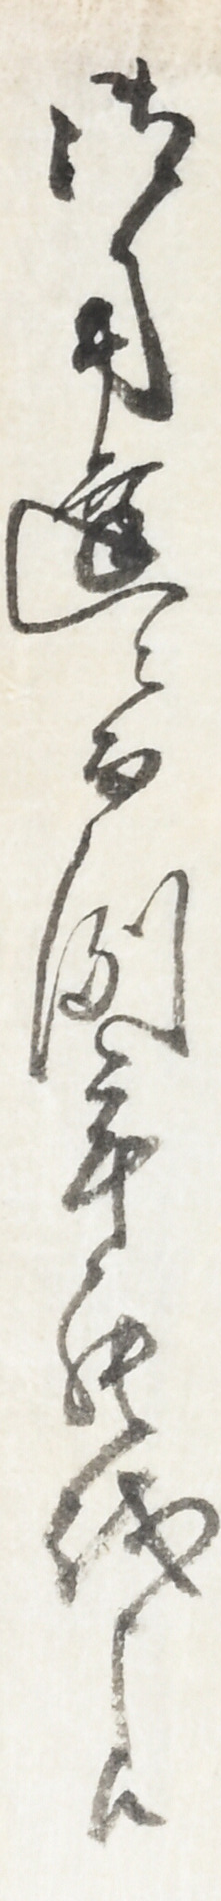御用達ニ而例年罷越申候

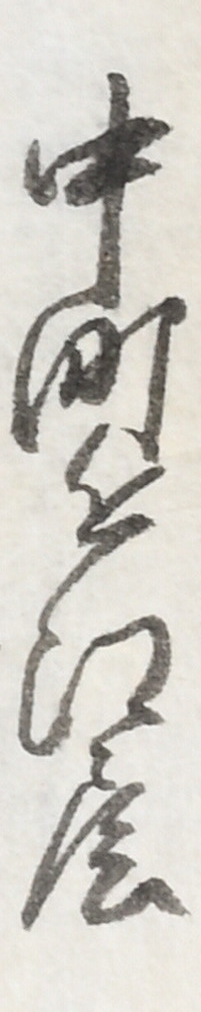中町近江屋
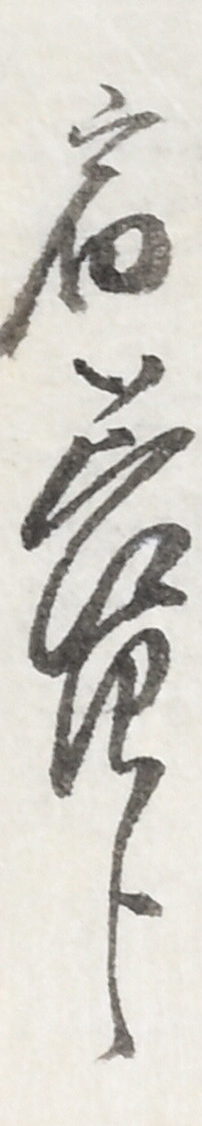宿善四郎
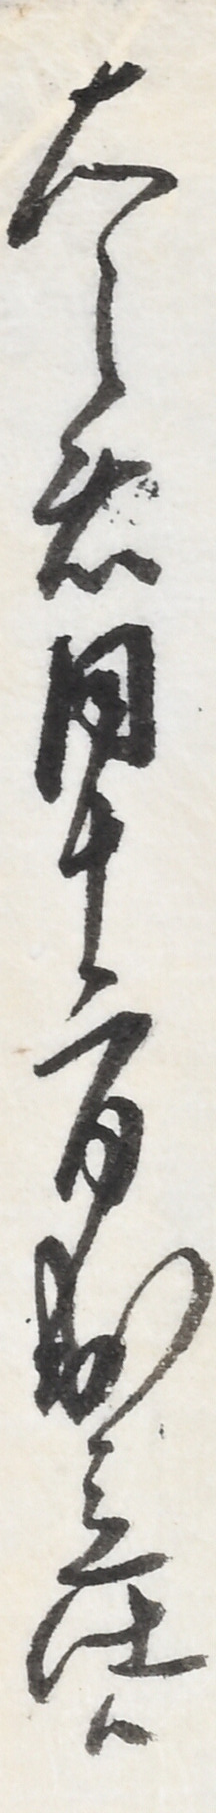右之者同十二日出立仕候
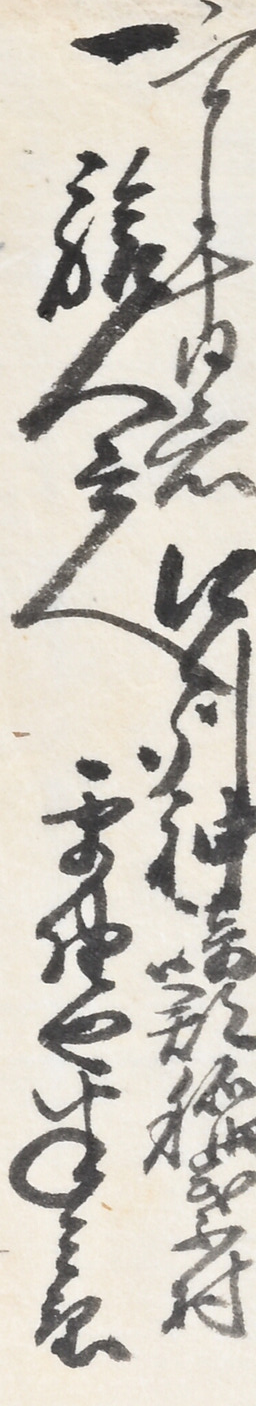一旅人壱人平野や半兵衛
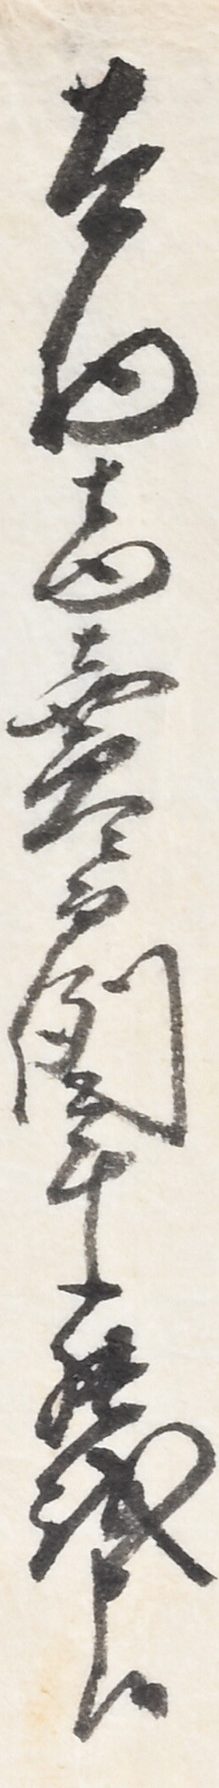太物商売ニ而例年罷越申候
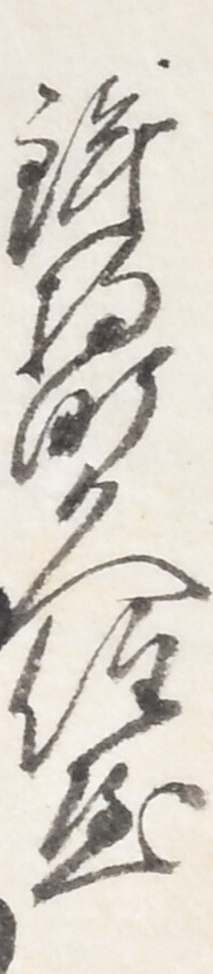鉾持町久住屋
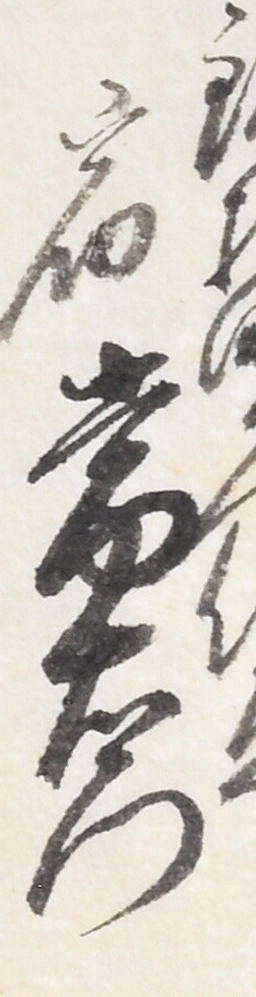宿常右衛門
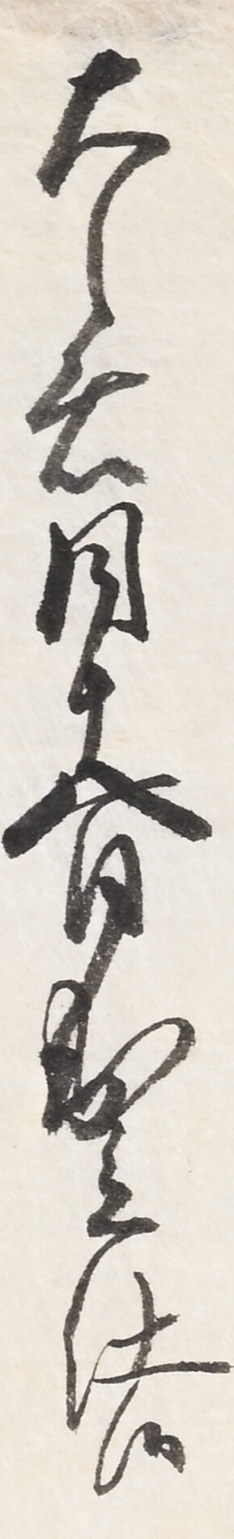右之者同十八日出立仕候
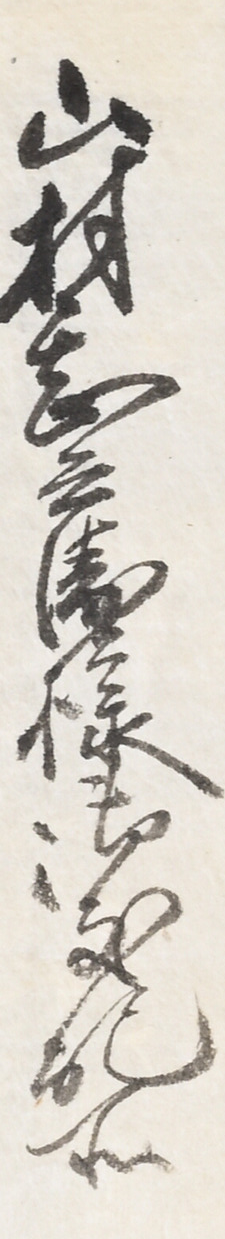山村甚兵衛様御支配所
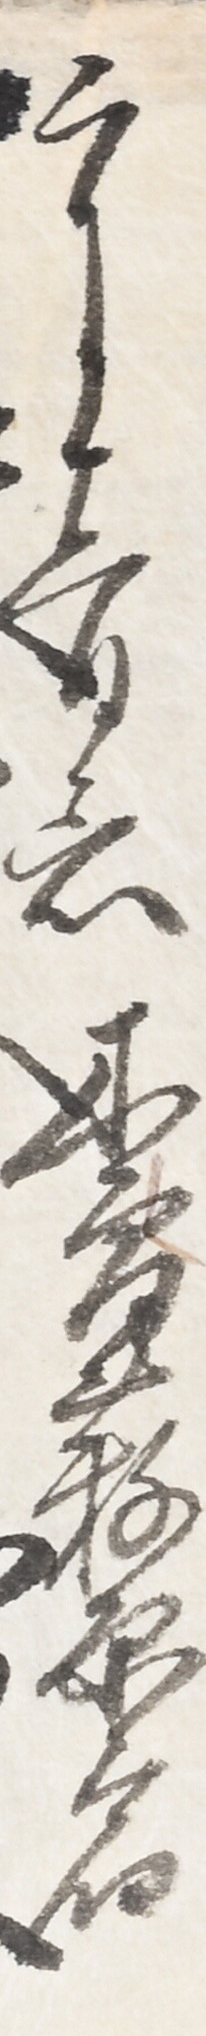二月十二日着木曽藪原宿
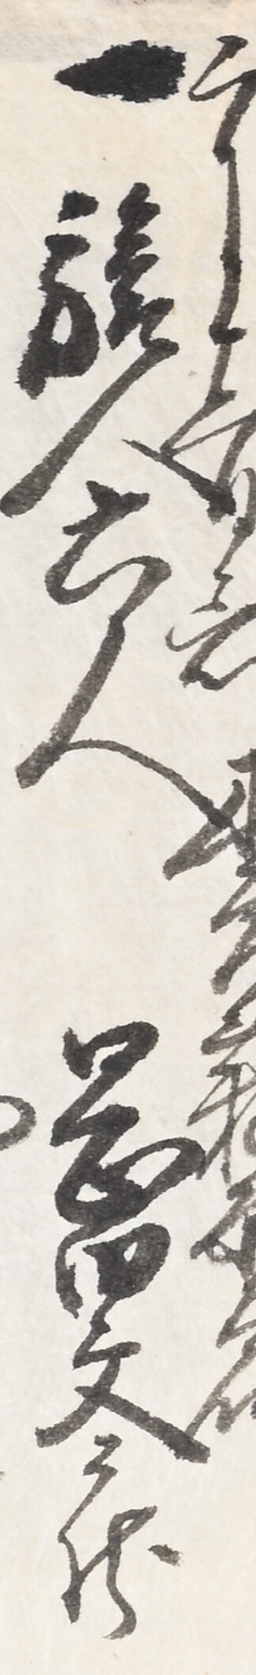一旅人六人岡田文蔵
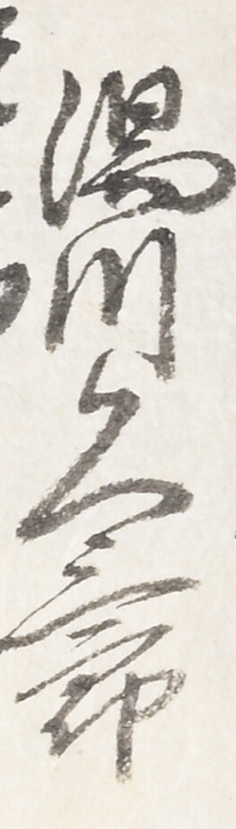湯川久三郎
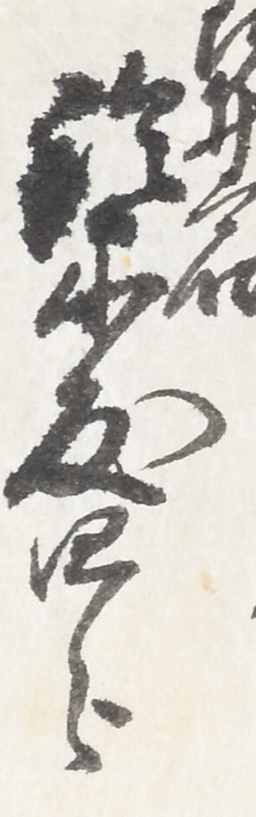鈴木友四郎
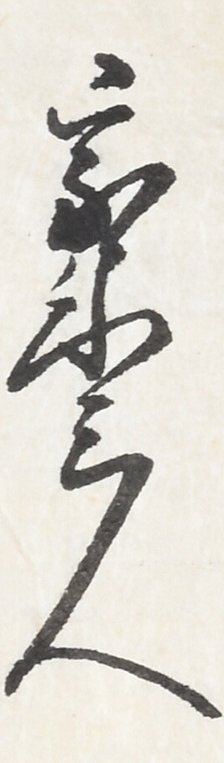家来三人
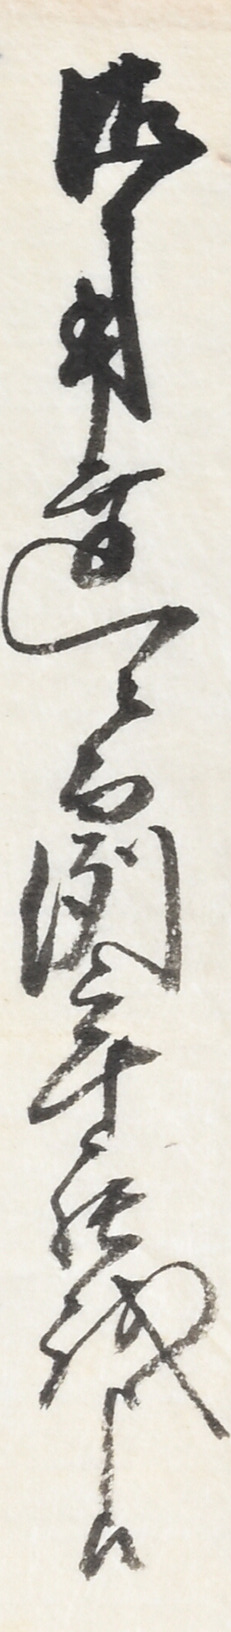御用達ニ而例年罷越申候
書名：旅人泊控帳
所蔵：伊那市立高遠町図書館・合同会社AMANE
